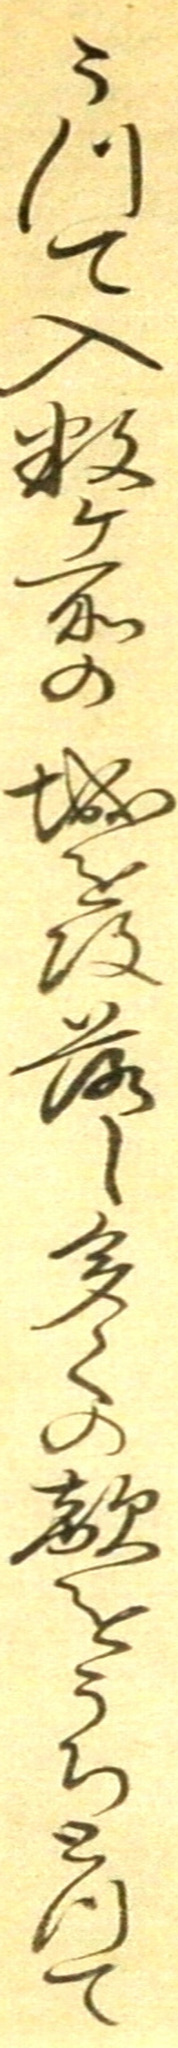うつて入数ヶ所の城を攻落し多くの多くの敵うちとつて
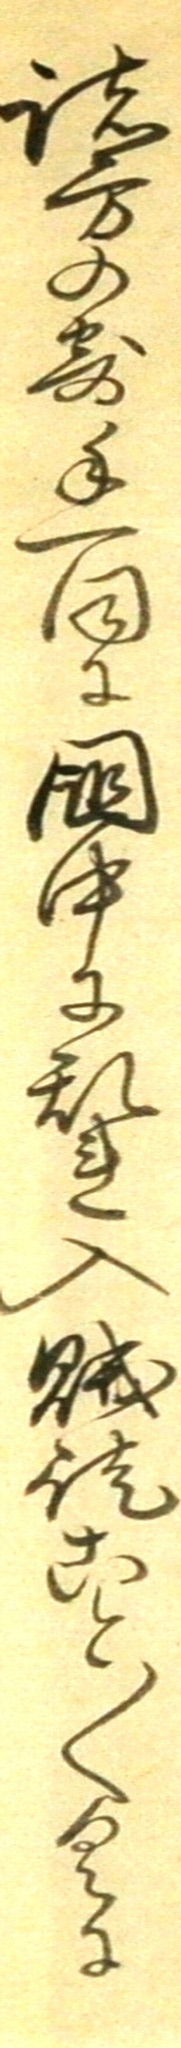諸方の寄手一同に国中に乱れ入賊徒こと〳〵くに
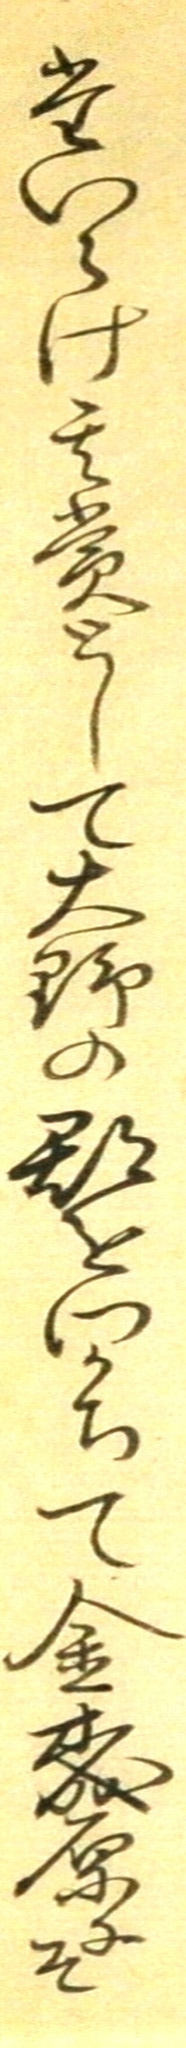たいらけ其賞として大野の郡をわかちて金森原にそ

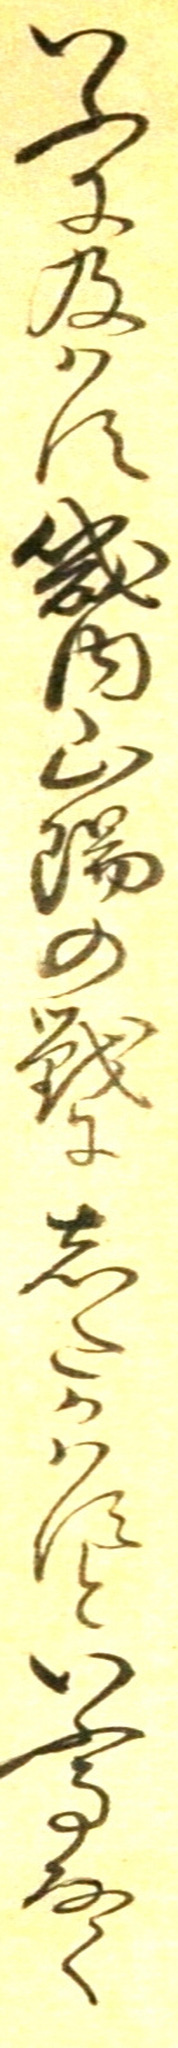いふに及はす畿内山陽の戦にしたかはすといふ事なく
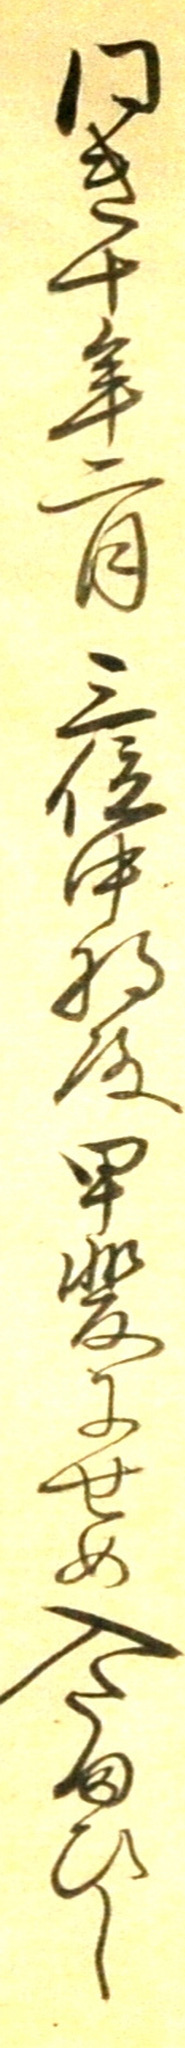同き十年二月三位中将殿甲斐にせめ入たまひし
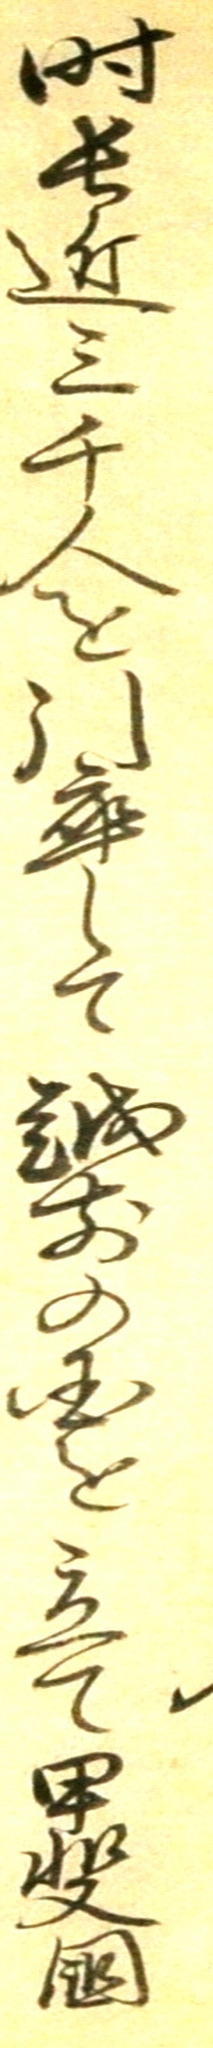時長近三千人を引率して越前の国を立て甲斐国
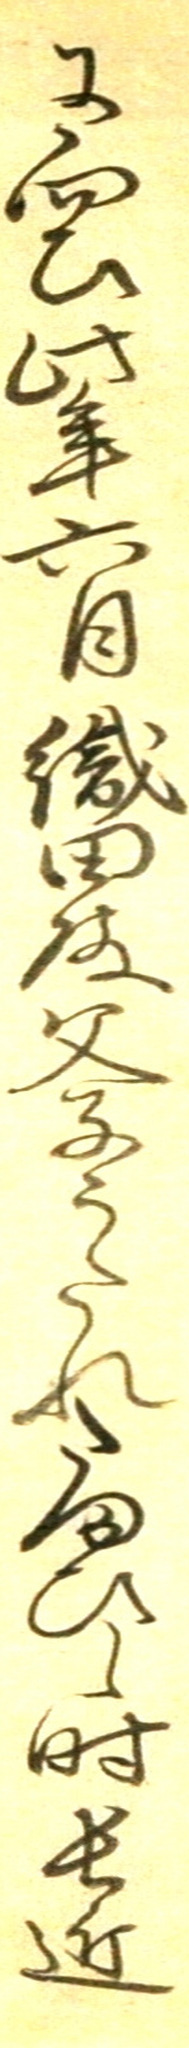に向ひ此年六月織田殿父子うたれたまひし時長近
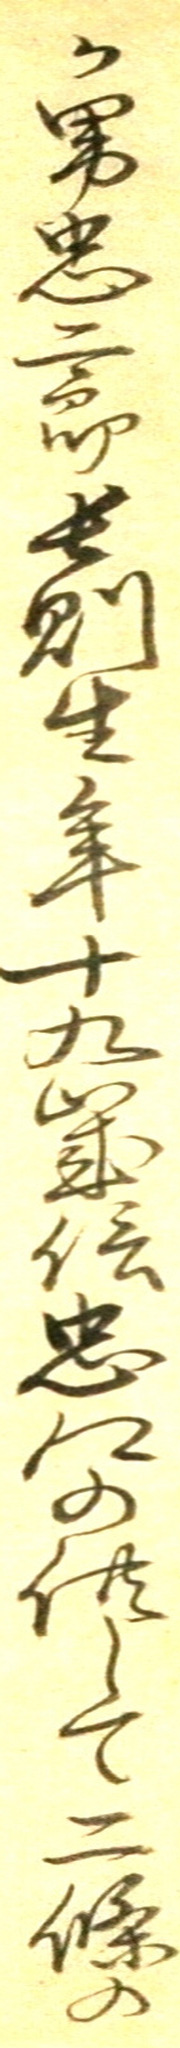か男忠二郎長則生年十九歳信忠卿の供して二条の
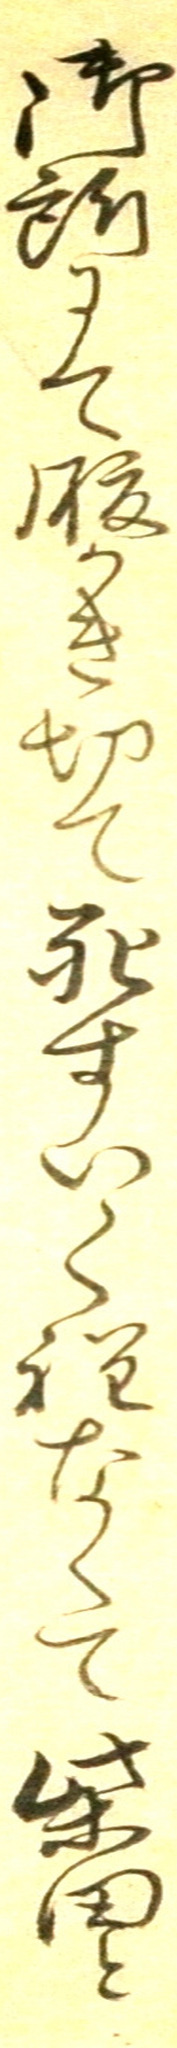御所にて腹かき切て死すいく程なくて柴田と
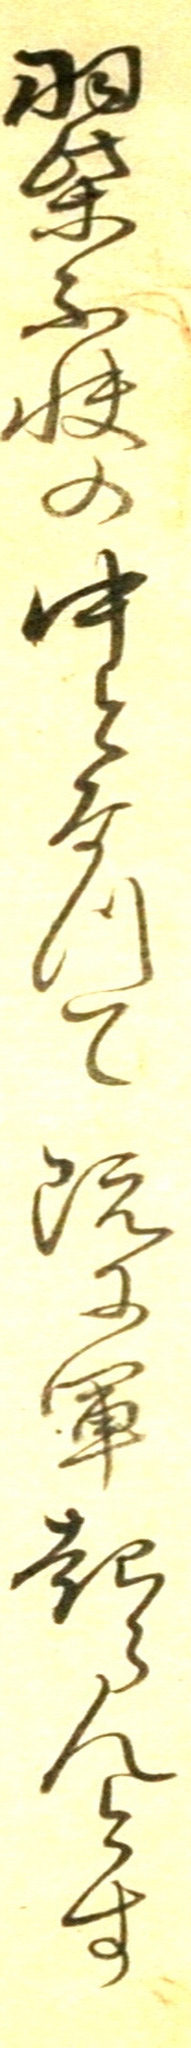羽柴不快の中となつて既に軍起らんとす
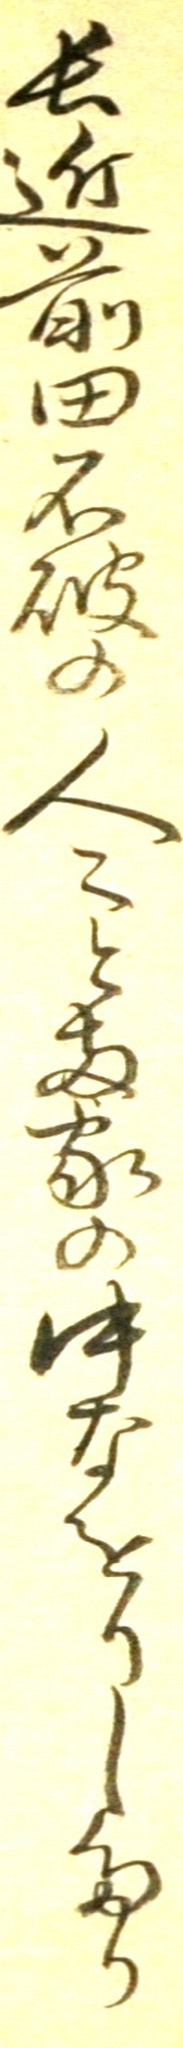長近前田不破の人々と両家の中なをりしたり
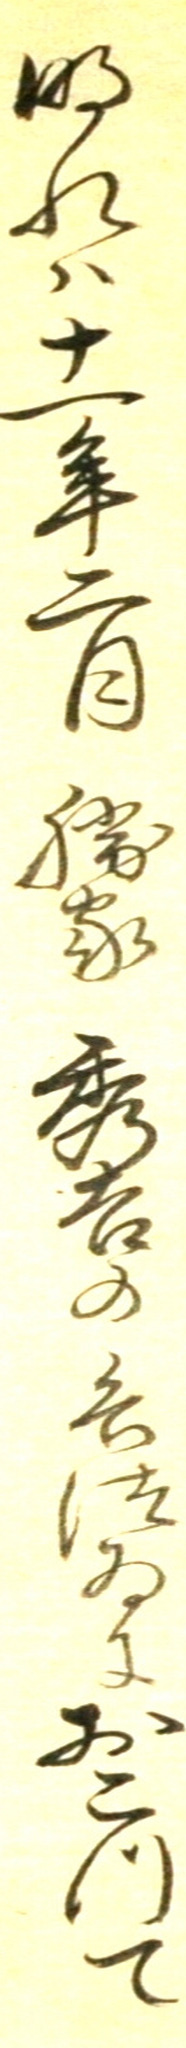明れは十一年二月勝家秀吉の兵つゐにおこつて
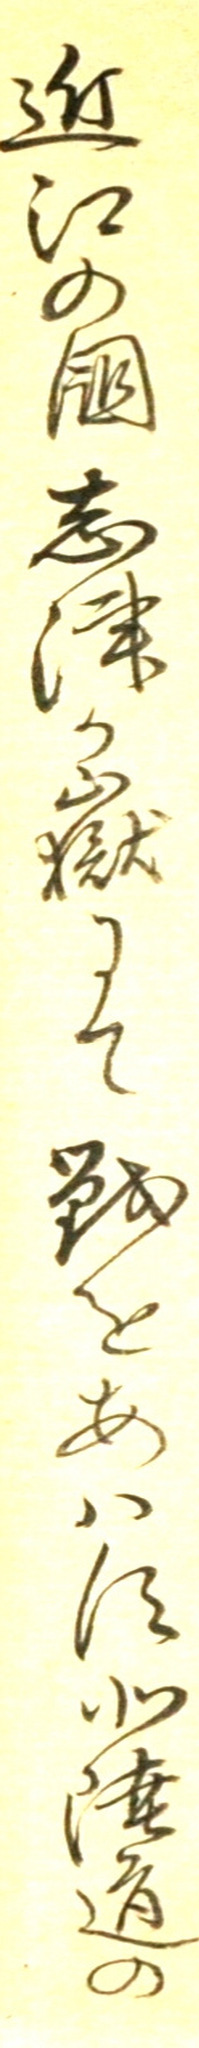近江の国志津か嶽にて戦をあはす北陸道の
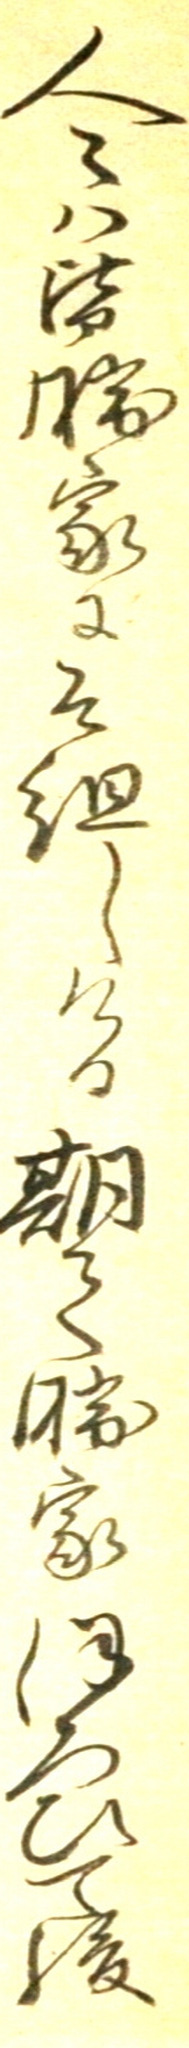人々は皆勝家にそ組しける期て勝家ほろひて後
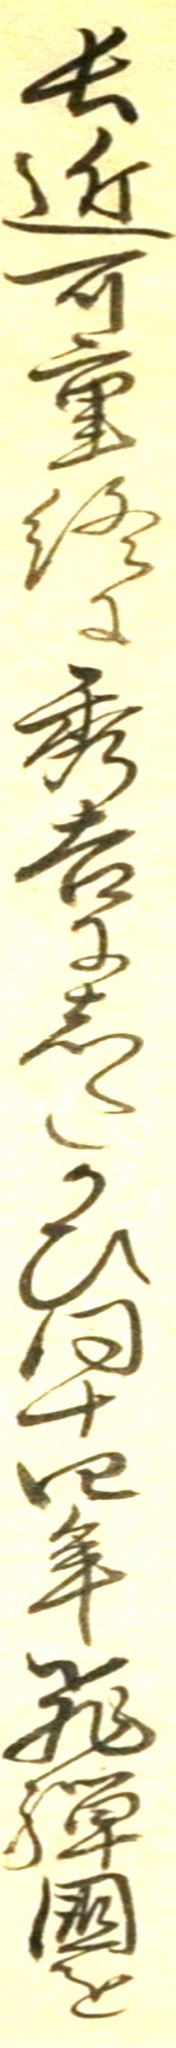長近可重終に秀吉にしたかひ同十四年飛騨国を
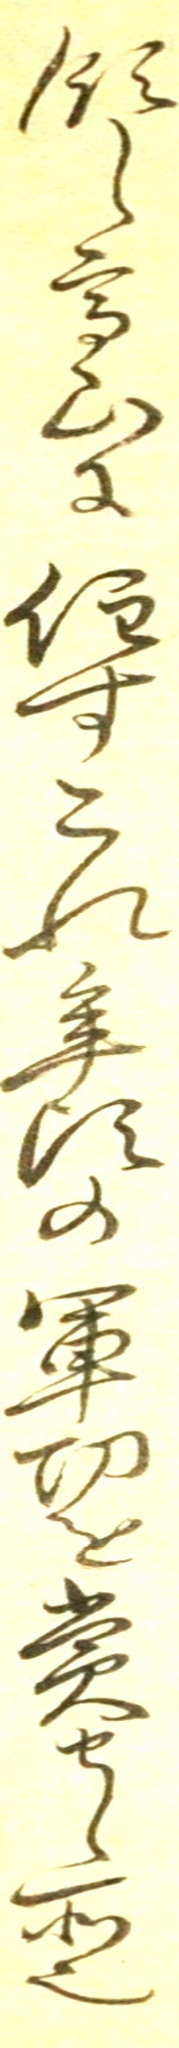領し高山に重すこれ年頃の軍功を賞せし所也
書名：藩翰譜（九・上）
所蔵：伊那市立高遠町図書館・合同会社AMANE
